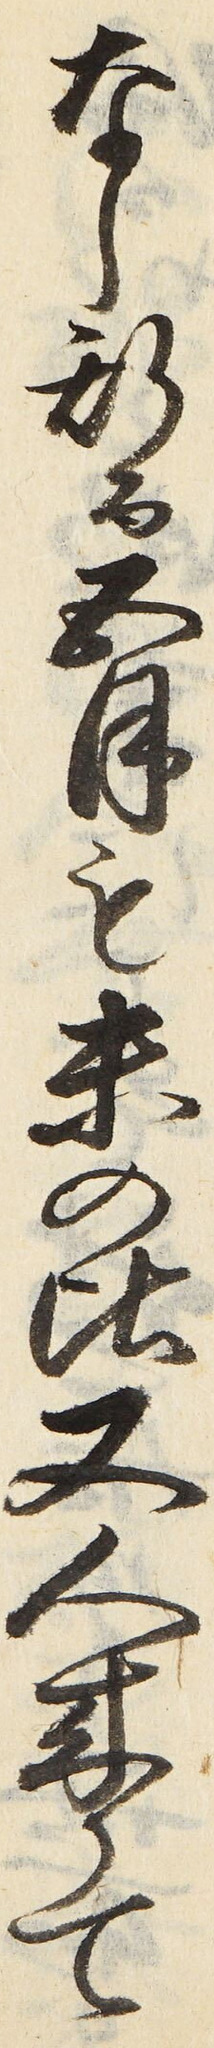なし斯而五月も末の頃又人来りて
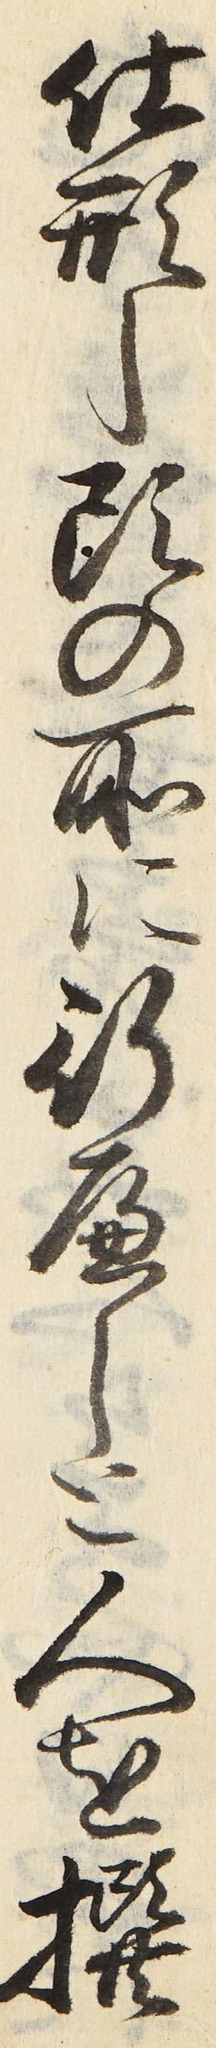仕形し頭の所に行へしと人を撰
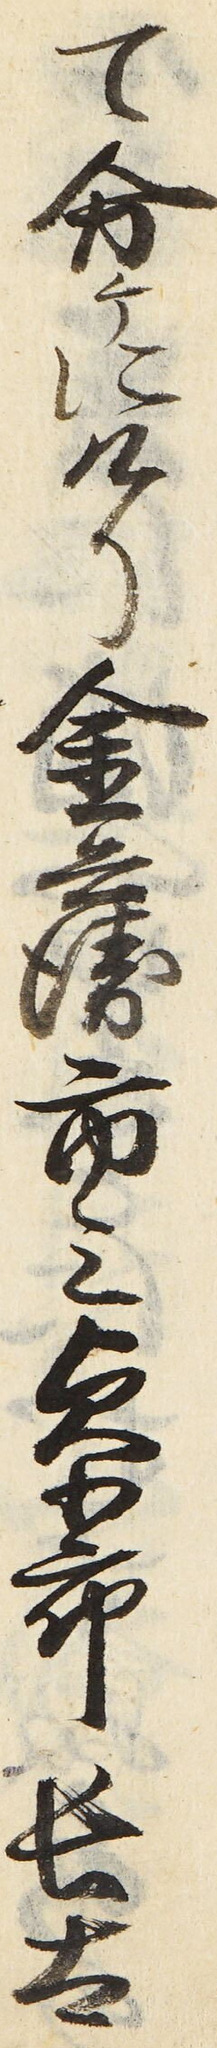て分けにけり金兵衛市三貞五郎長太
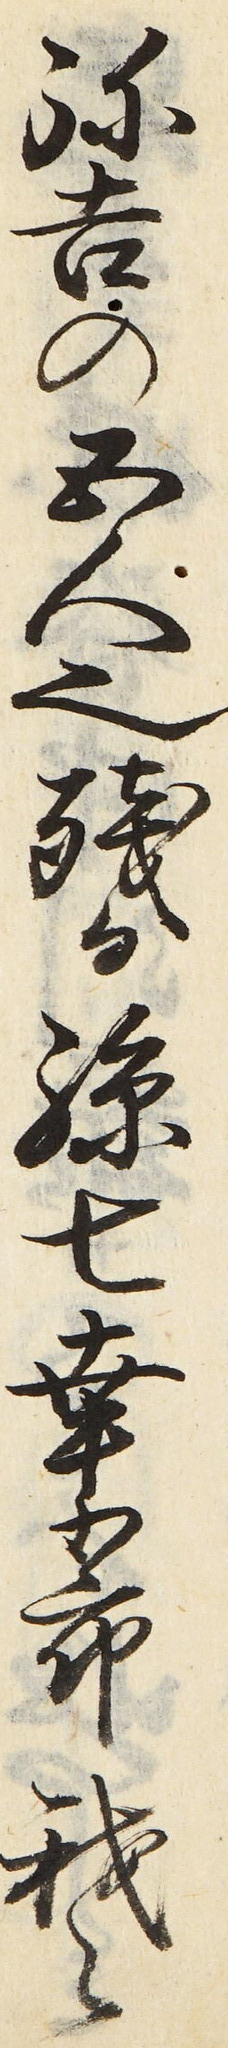弥吉の五人也残る孫七幸五郎我々
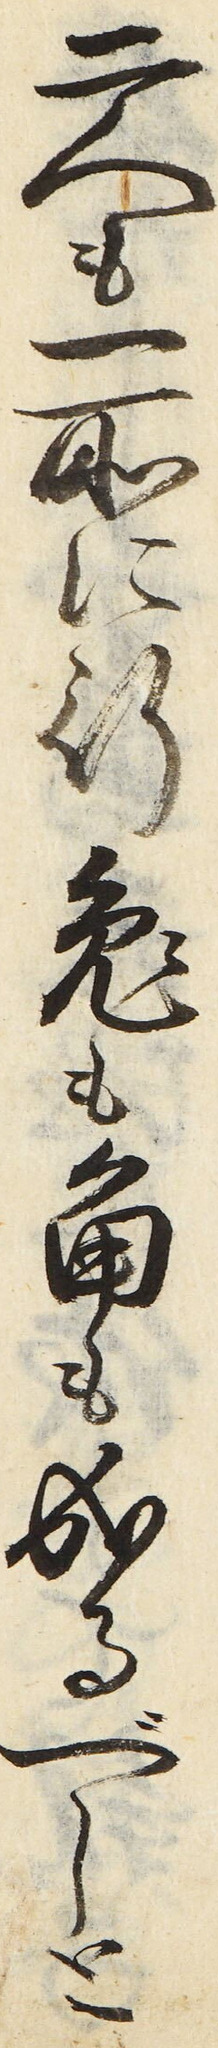二人も一所に行兎も角も成るべしと
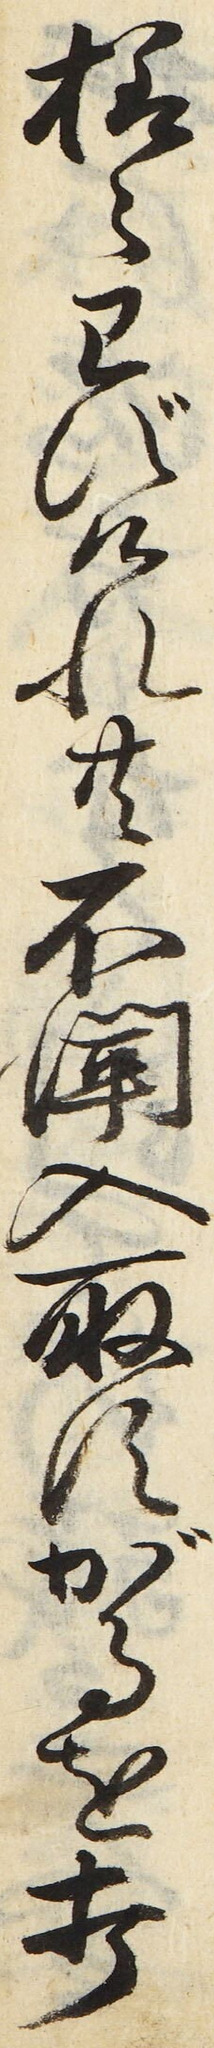様々わびけれ共不聞入取すがるを打

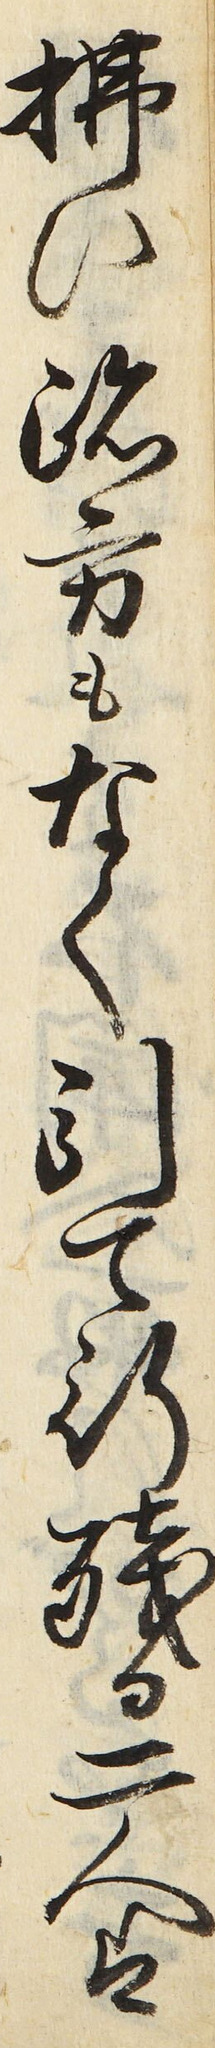払ひ跡方もなく引て行残る二人は
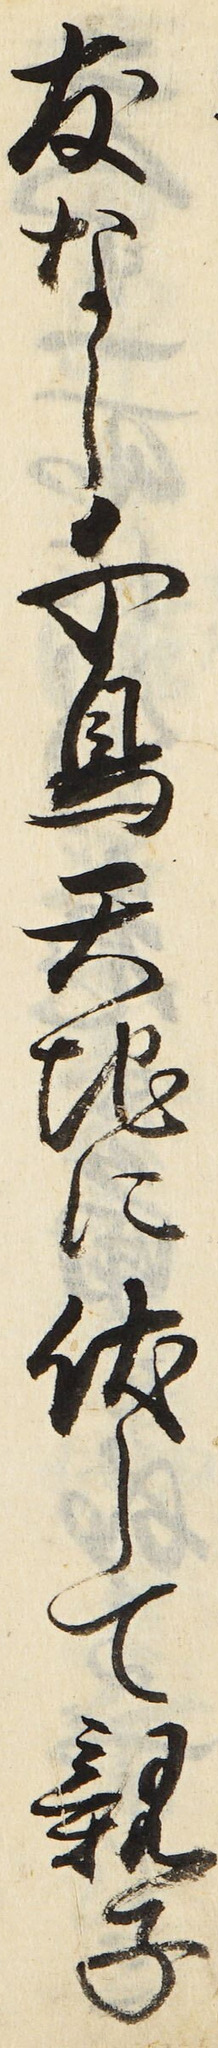友なし千鳥天地に伏して親子
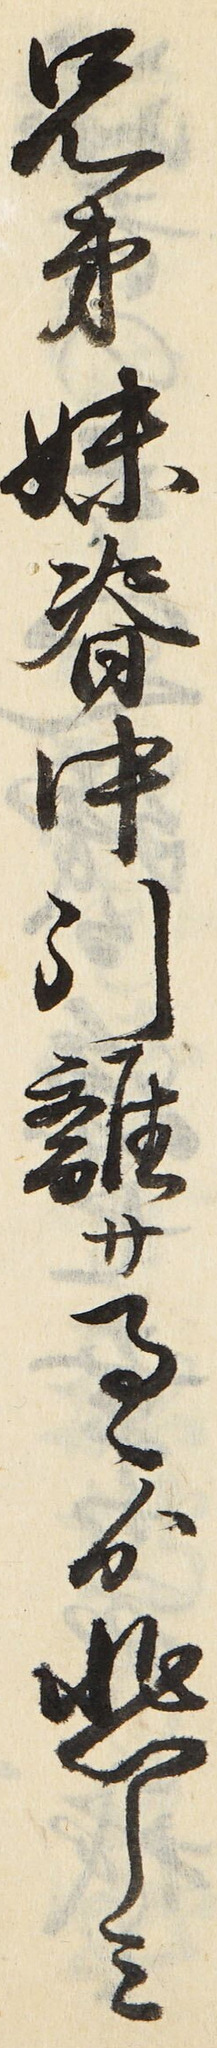兄弟妹背中引離さるゝゟ悲しみ
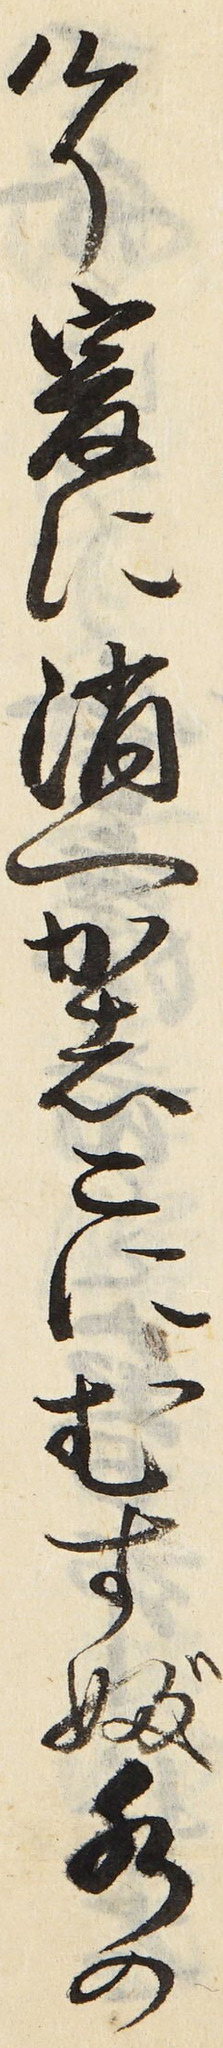けり爰に消へかしこにむすぶ水の
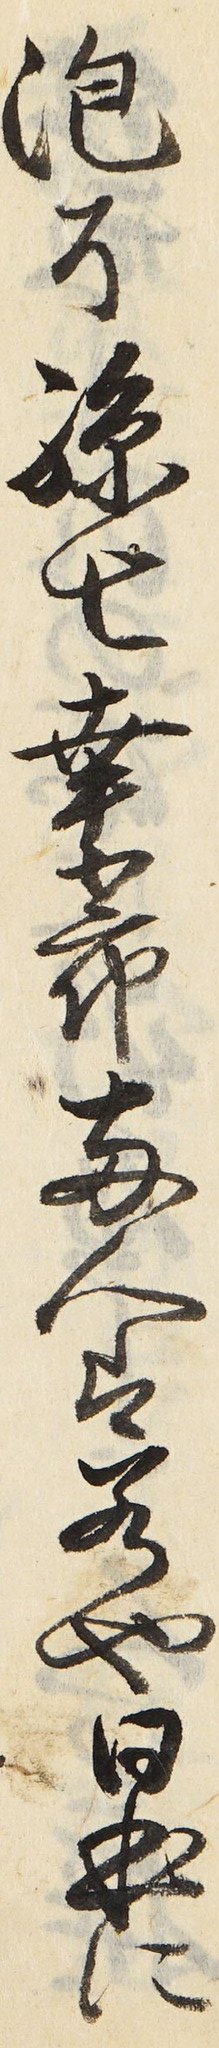泡に孫七幸五郎両人は若や日本に
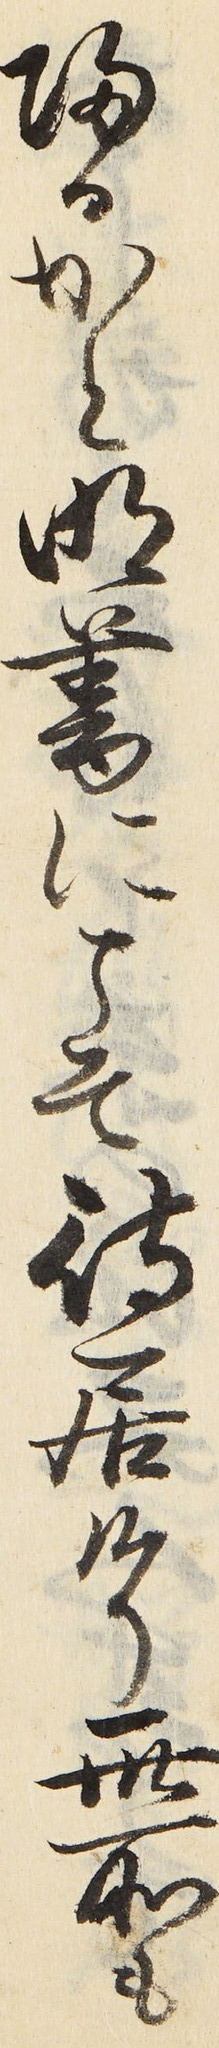帰るかと明暮にこそ待居けり此所も
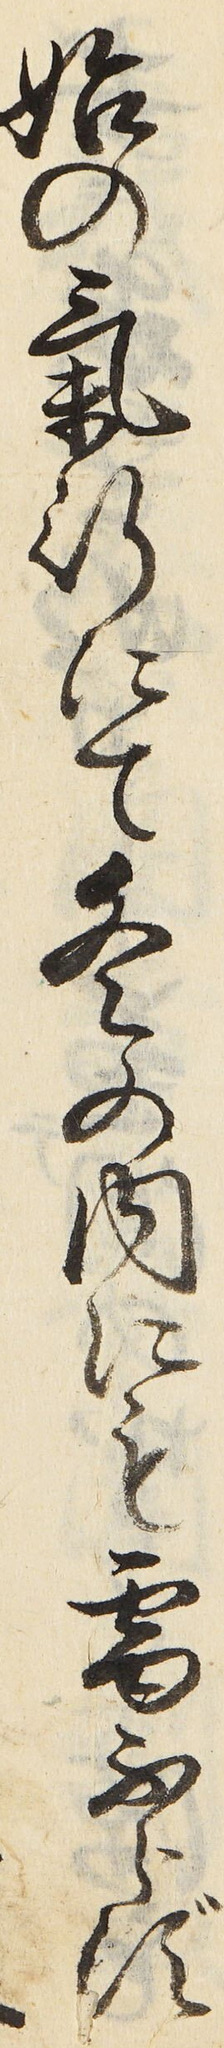始の気行にて冬の内にも雪ふらず
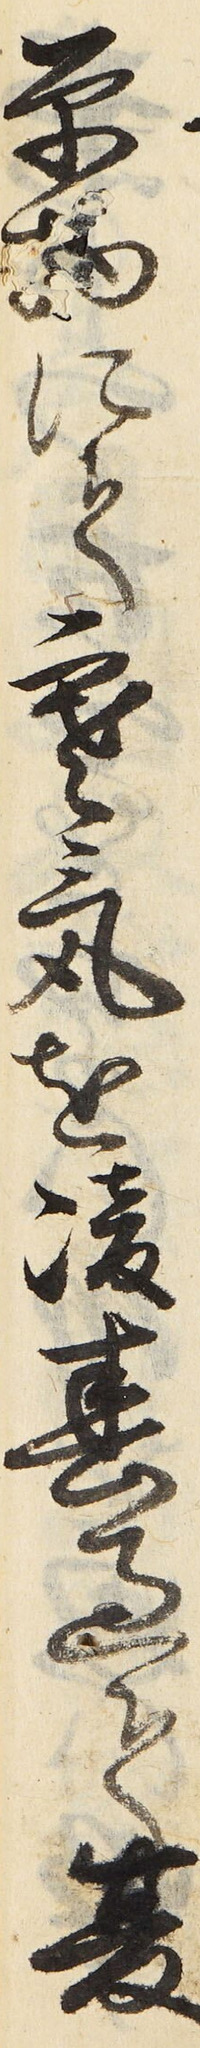単物にて寒気を凌春過て夏
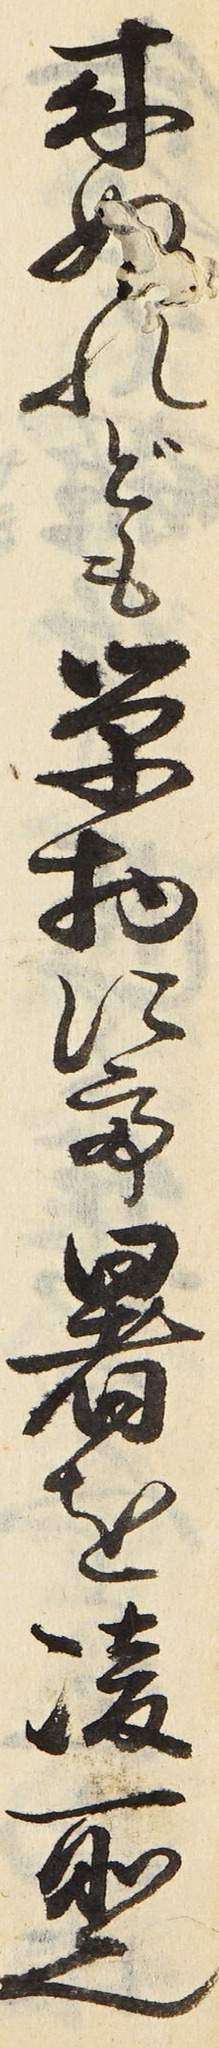来ぬれども単物にて暑を凌所也
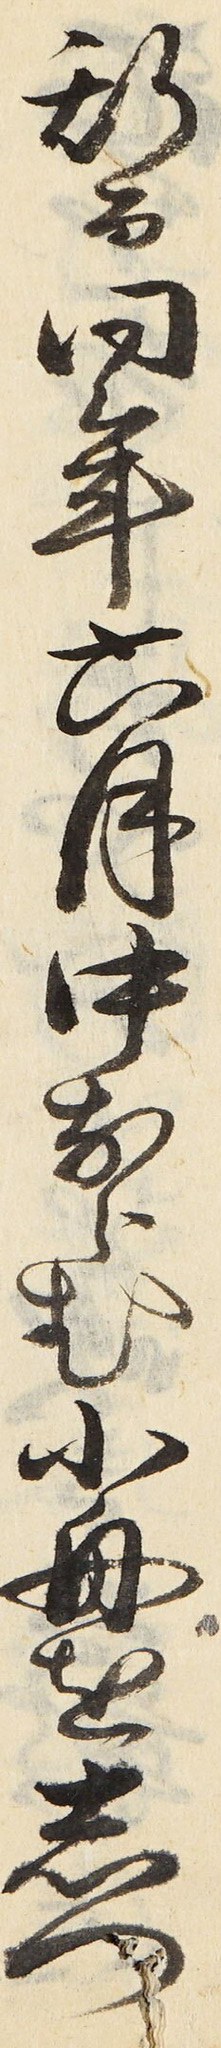斯而同年六月中ならむ小舟をしつ
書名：華夷九年録
